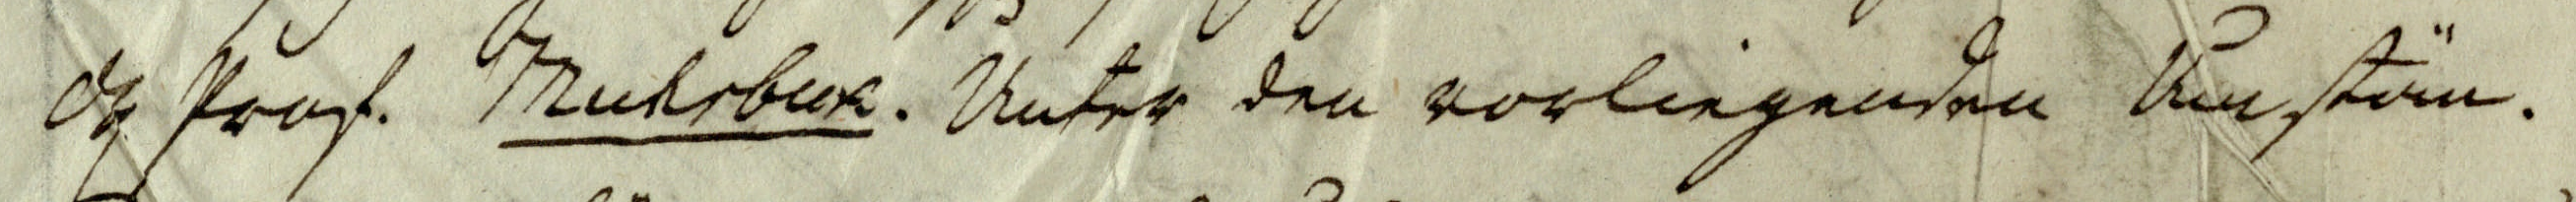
dh. Prof. Muhrbeck. Unter den vorliegenden Umstän¬
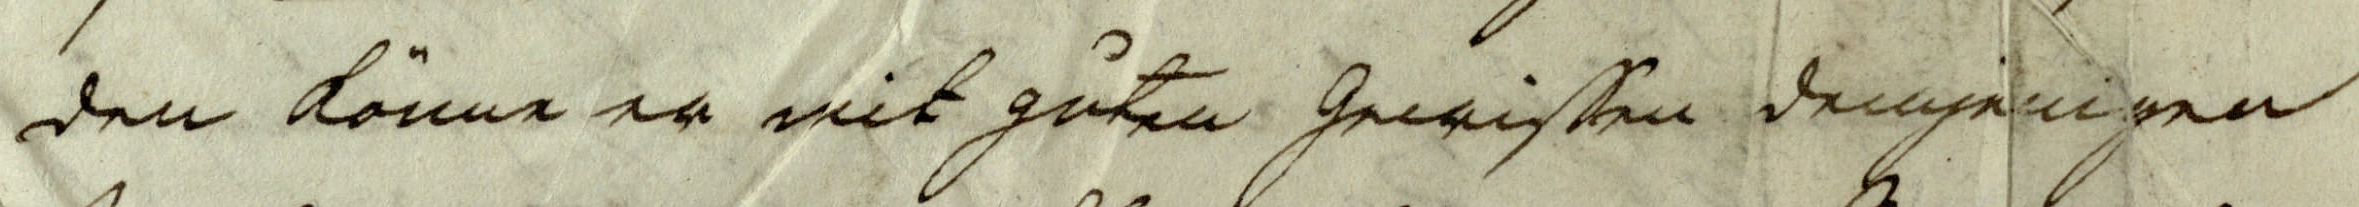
den könne er mit guten Gewissen demjenigen
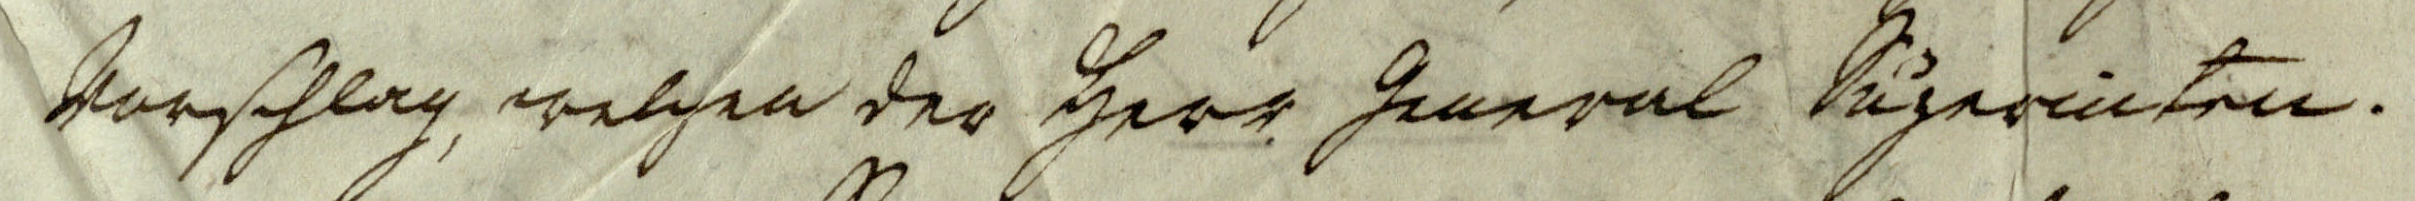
Vorschlag, welchen der Herr General Superinten¬
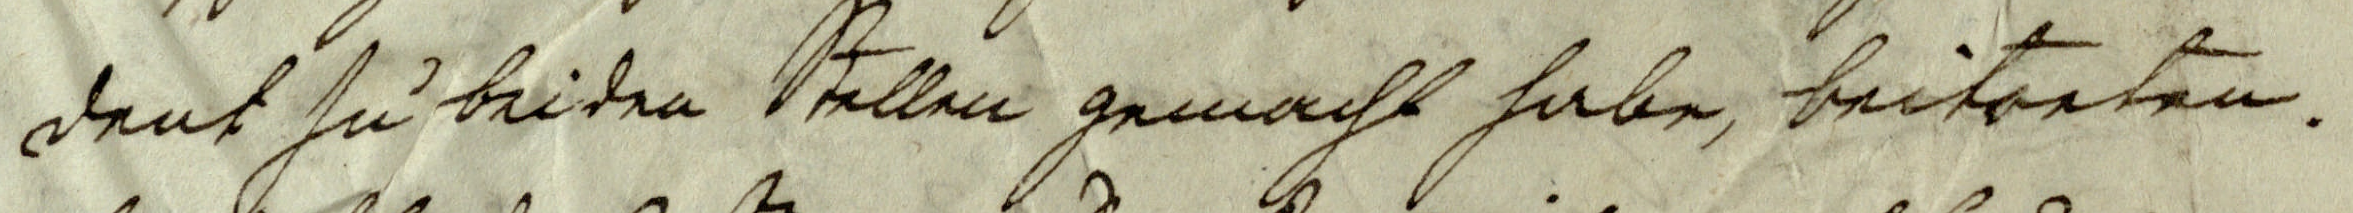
dent zu beiden Stellen gemacht habe, beitreten.
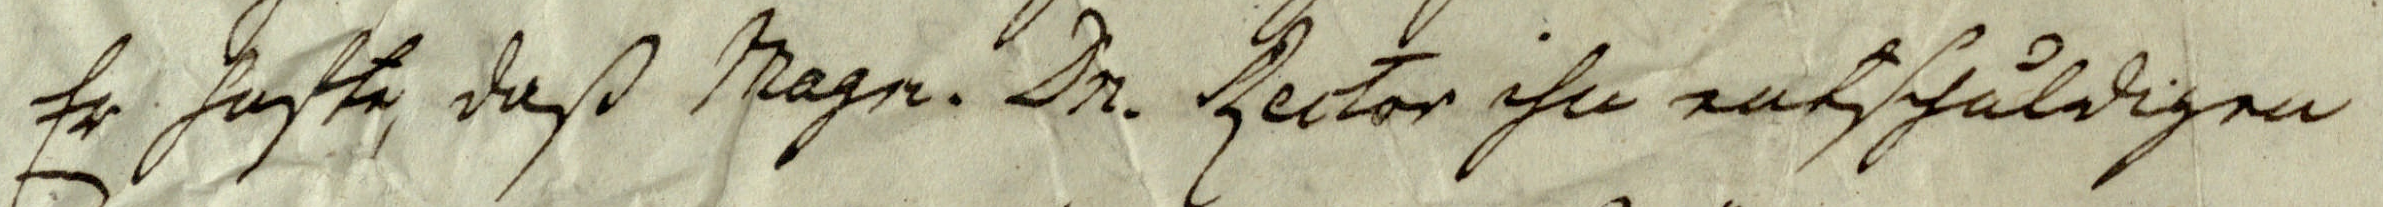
Er hofte, daß Magn. Dn. Rector ihn entschuldigen
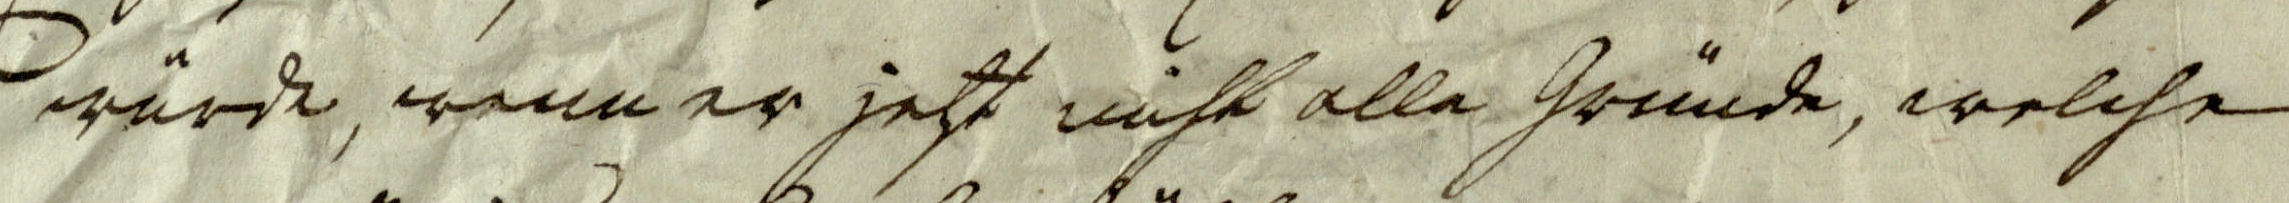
würde, wenn er jetzt nicht alle Gründe, welche
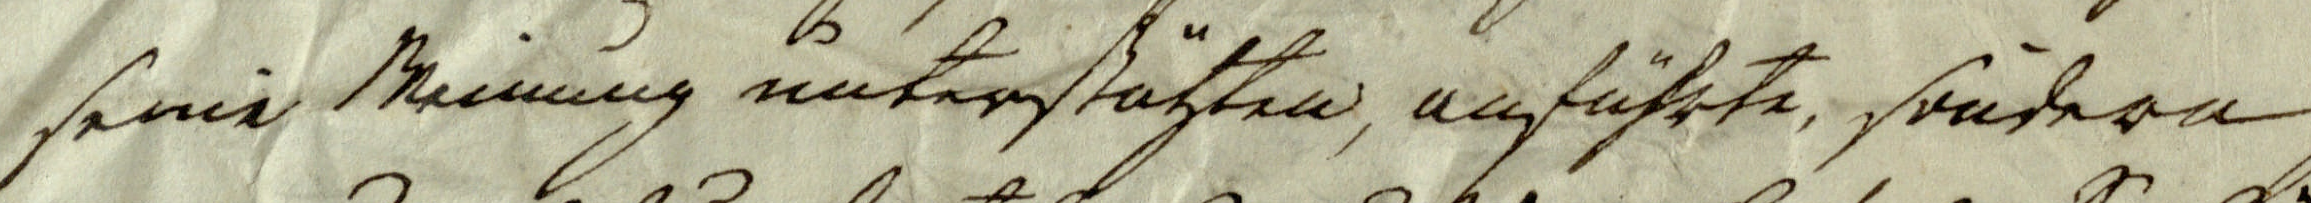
seine Meinung unterstützten, anführte, sondern
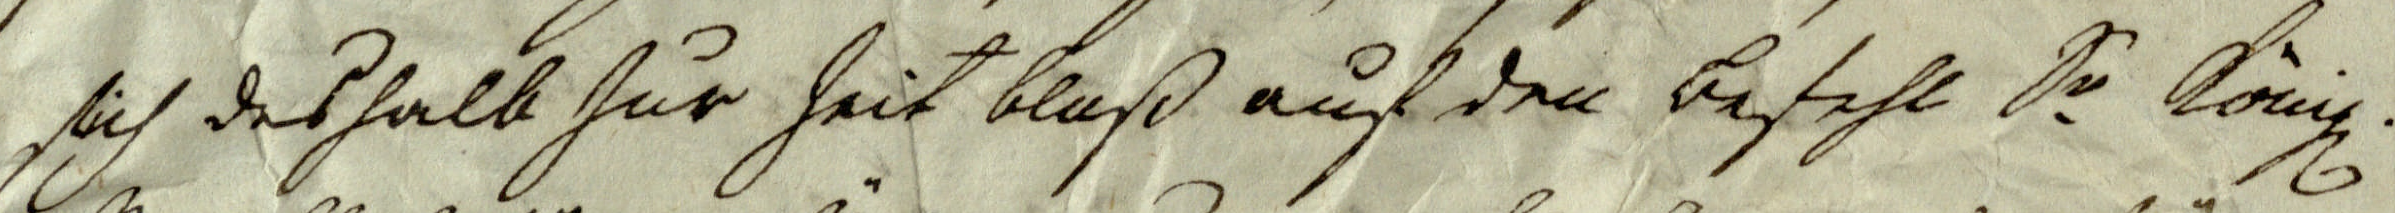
sich deshalb zur Zeit bloß auf den Befehl Sr. Königl.
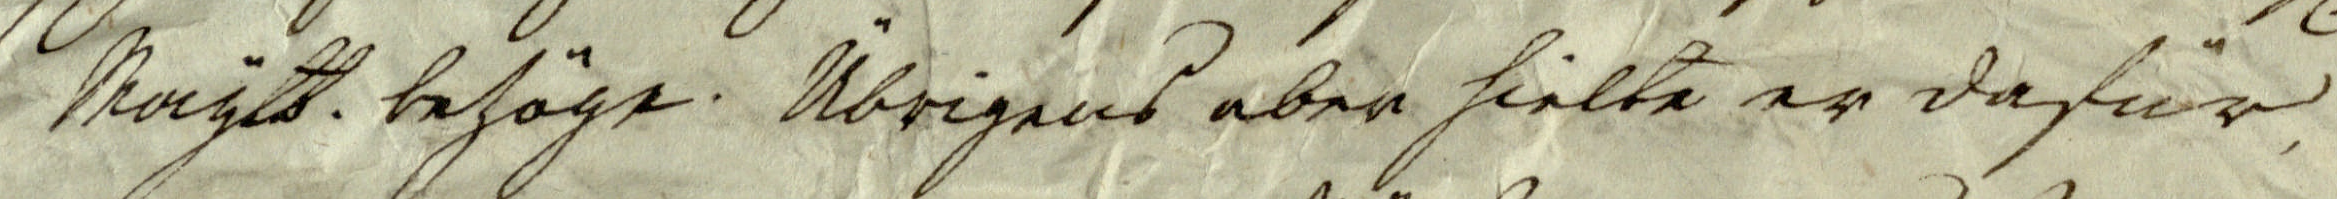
Maÿst. bezöge. Übrigens aber hielte er dafür,
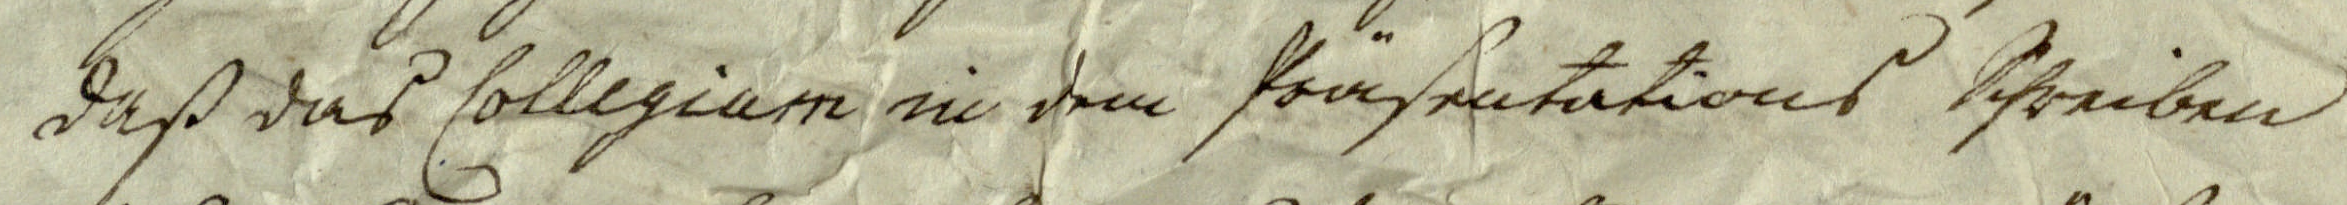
daß das Collegium in dem Präsentations Schreiben
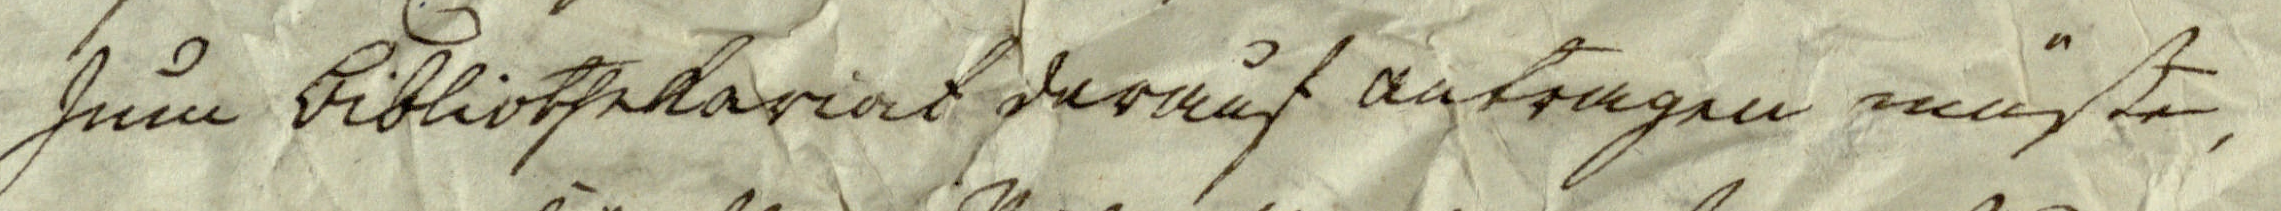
zum Bibliothekariat darauf antragen müsste,
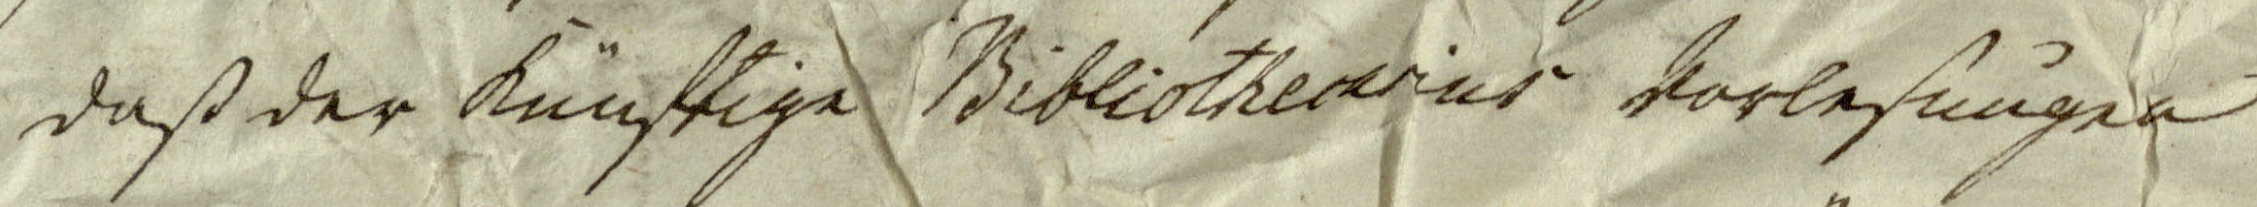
daß der künftige Bibliothecarius Vorlesungen
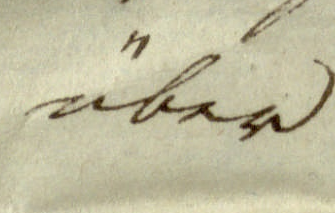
über
